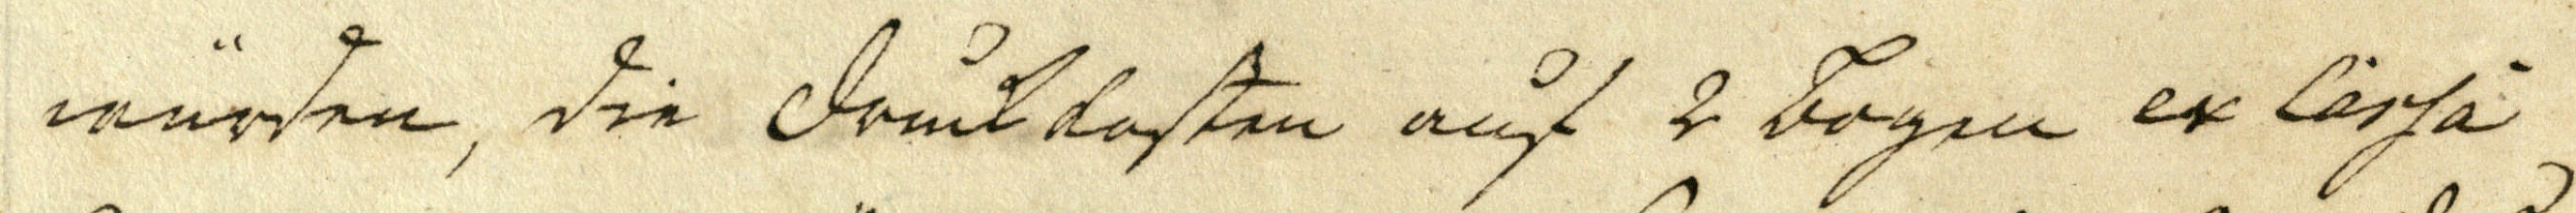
wären , die Druck kosten auf 2 Bogen ex Cassa
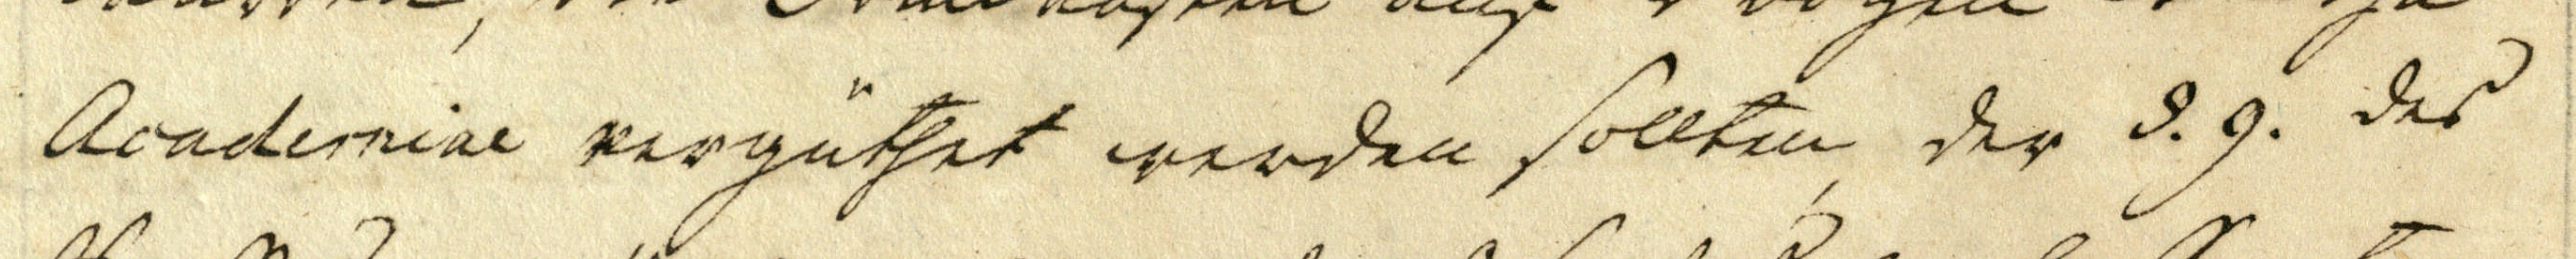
Academiae vergüthet werden sollten der §. 9. des
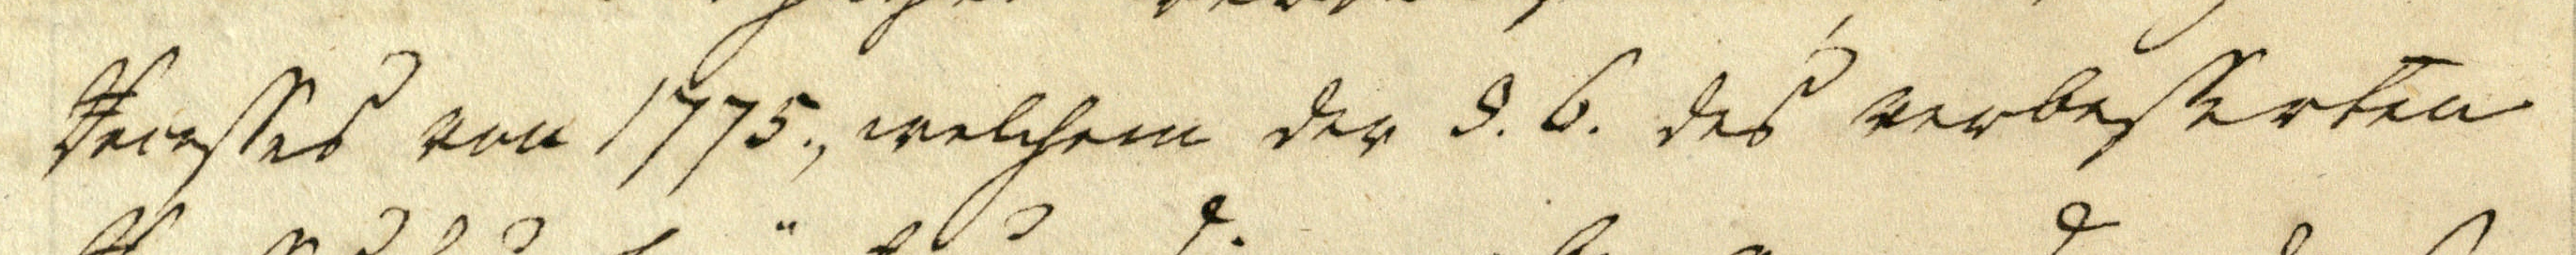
Recesses von 1775., welchem der §. 6. des verbesserten
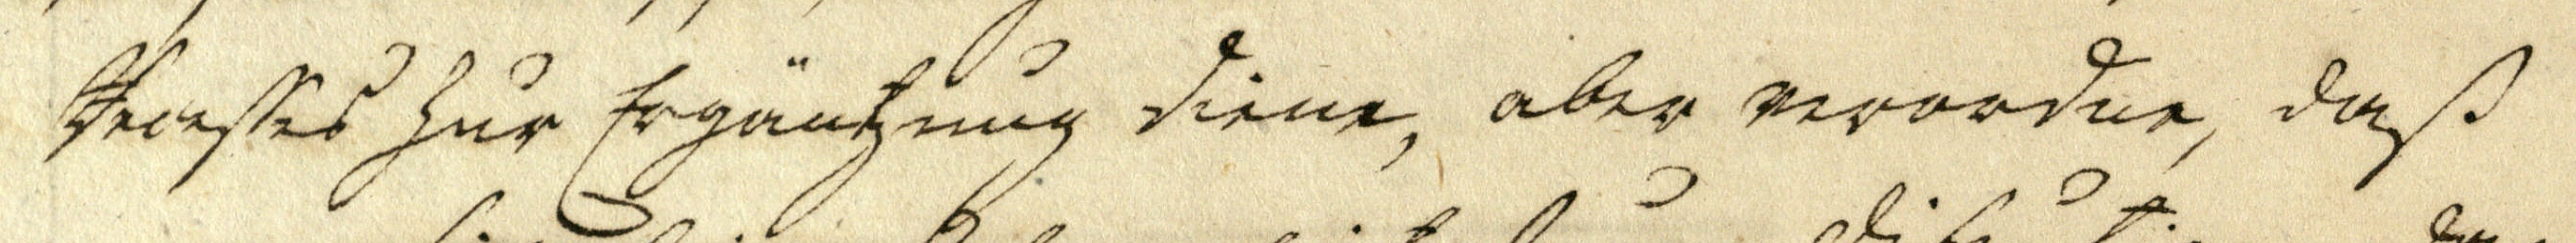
Recesses zur Ergäntzung diene, aber verordne, daß
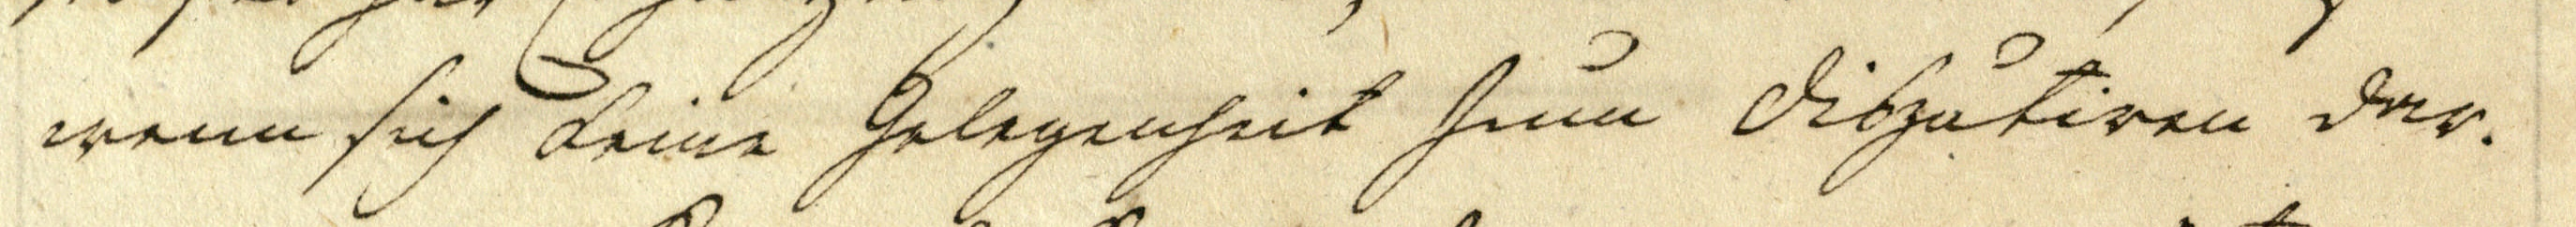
wenn sich keine Gelegenheit zum Disputiren dar¬
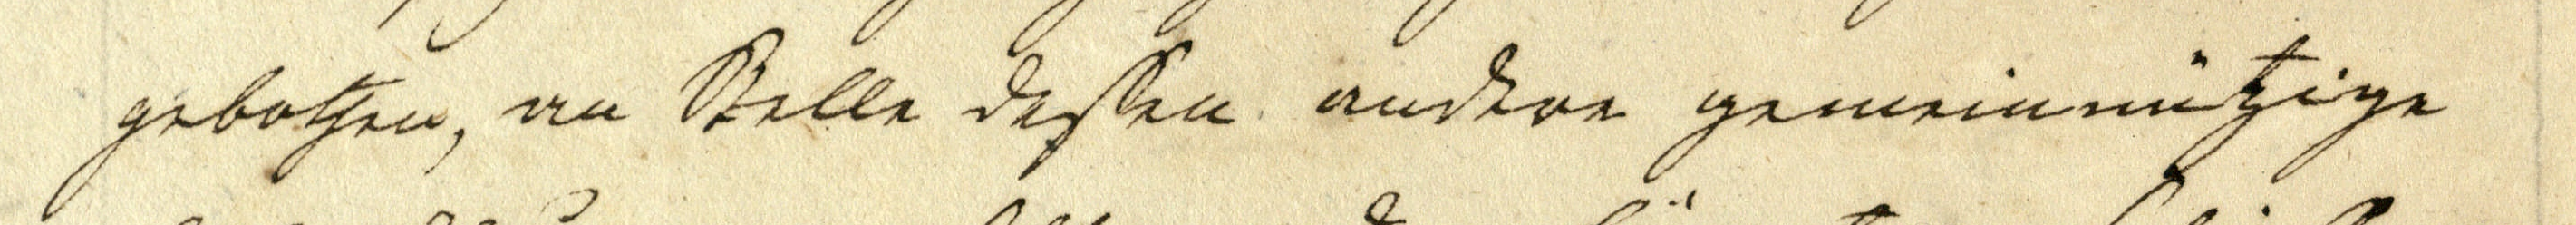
gebothen, an Stelle dessen andere gemeinnützige
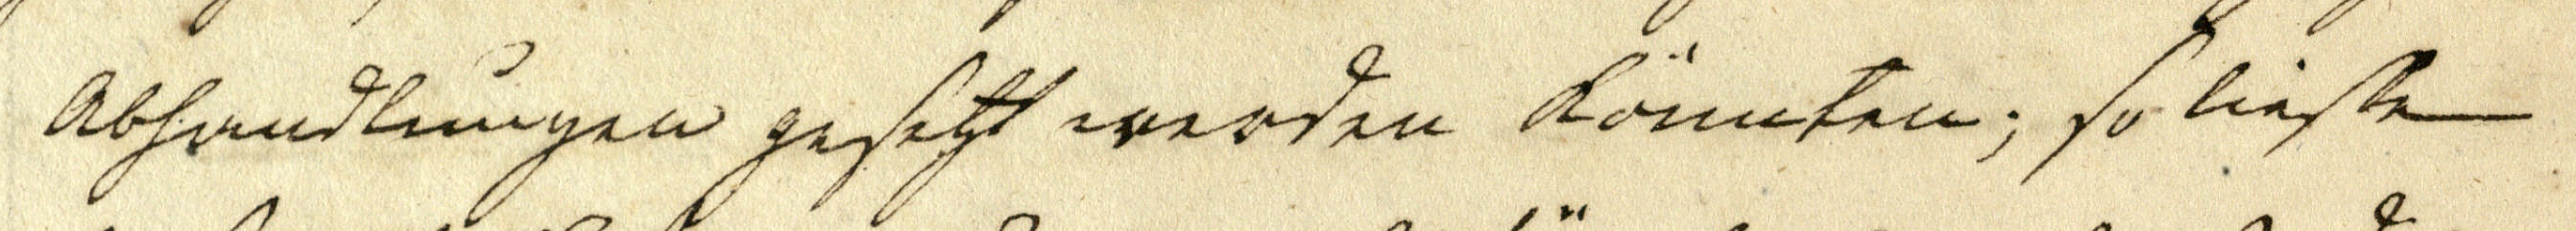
Abhandlungen gesetzt werden könnten, so liesse
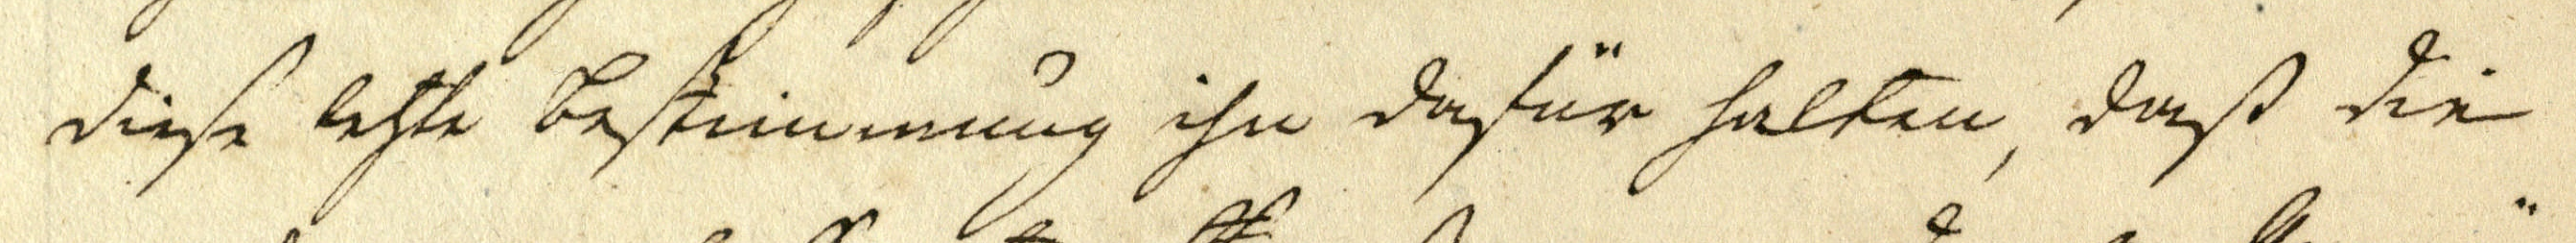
diese letzte Bestimmung ihn dafür halten, daß die
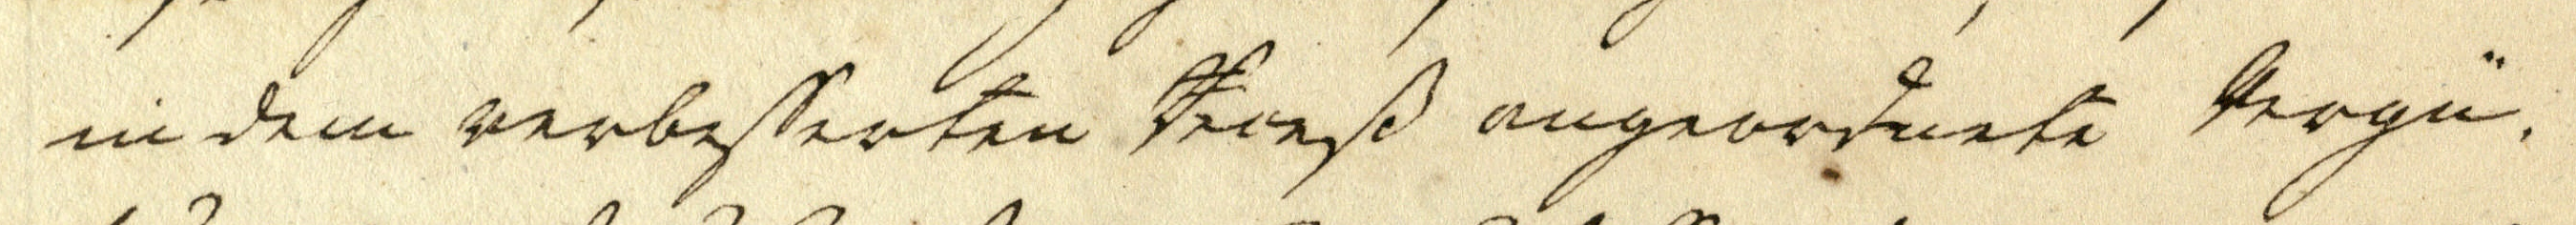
in dem verbesserten Receß angeordnete Vergü¬
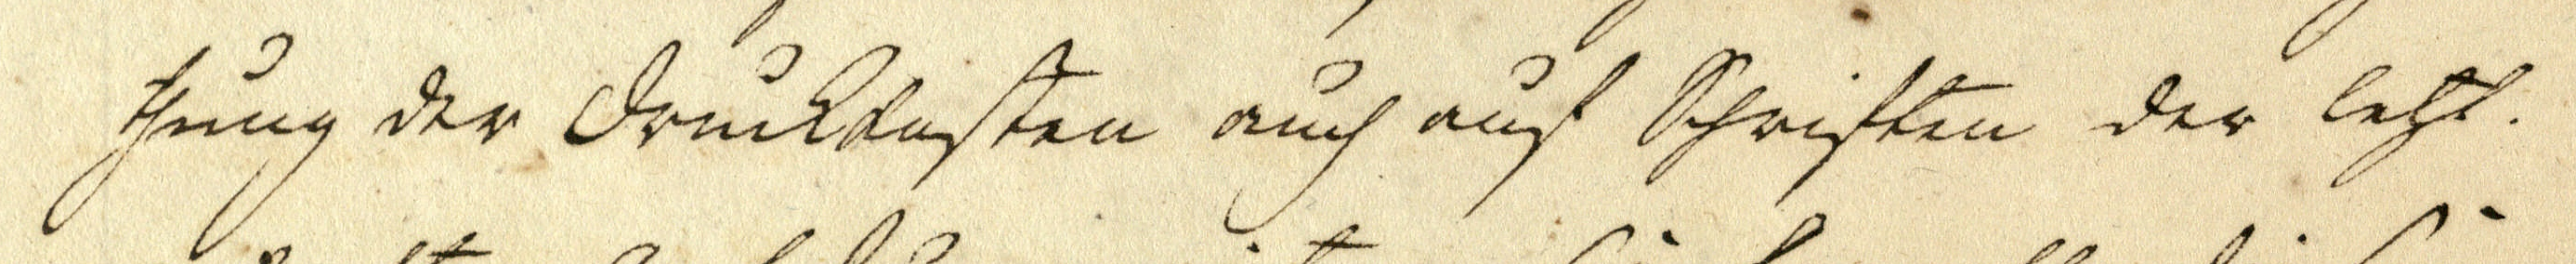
thung der Druckkosten auch auf Schriften der letzt¬
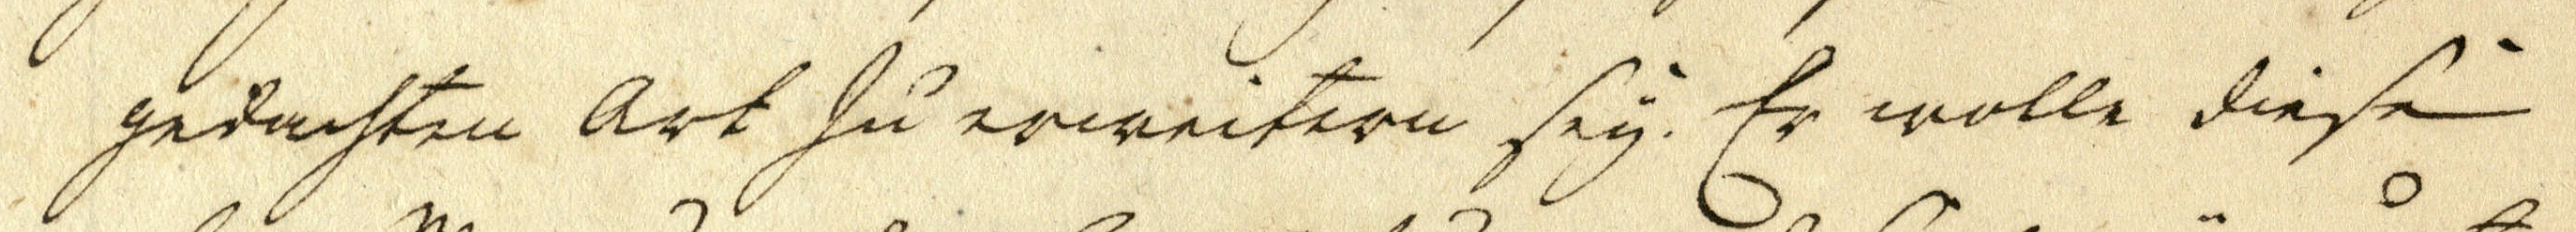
gedachten Art zu erweitern seÿ. Er wolle diese
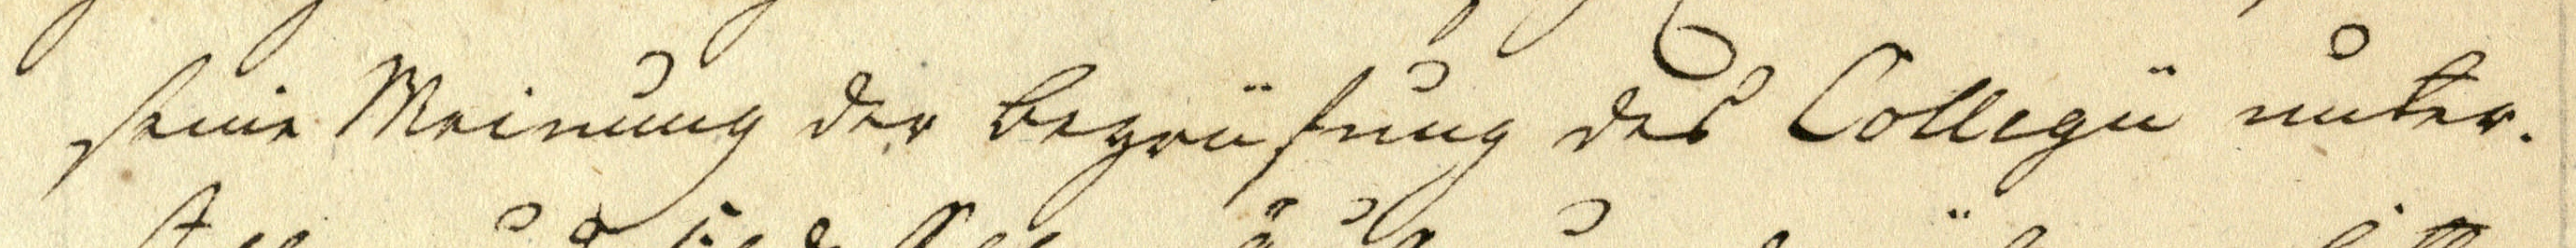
seine Meinung der Beprüfung des Collegii unter¬
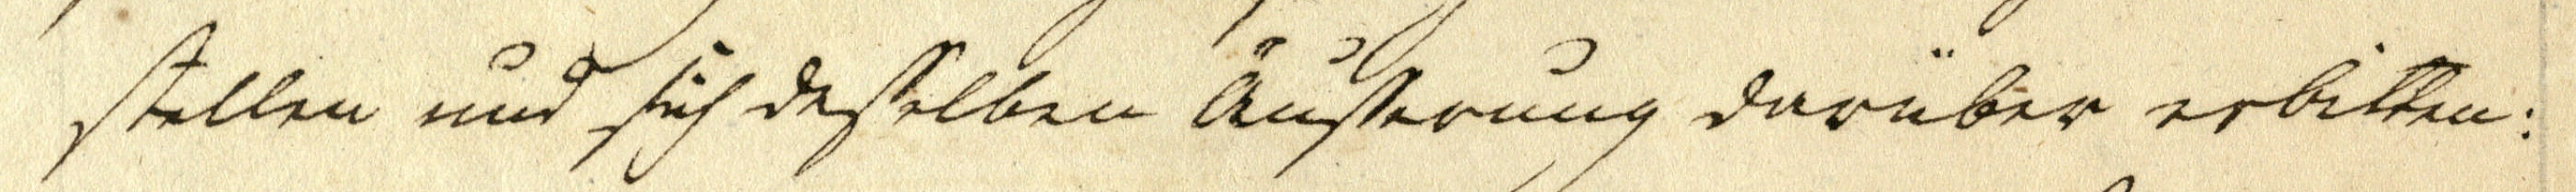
stellen und sich desselben Äusserung darüber erbitten:
